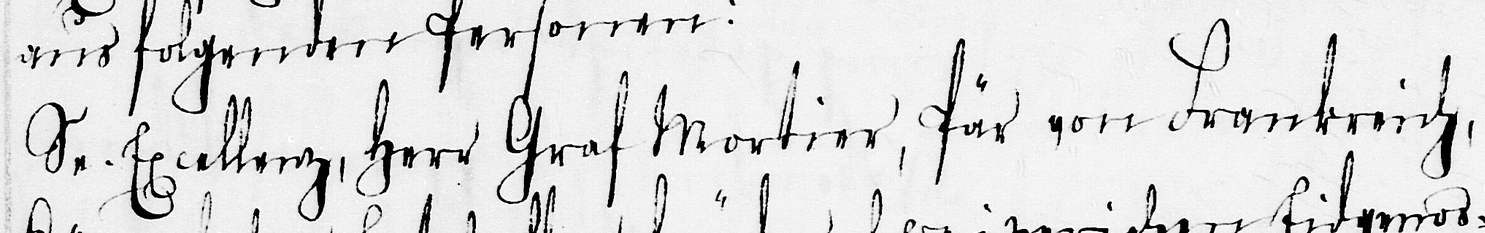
Se. Excellenz, Herr Graf Mortier, Pär von Frankreich,
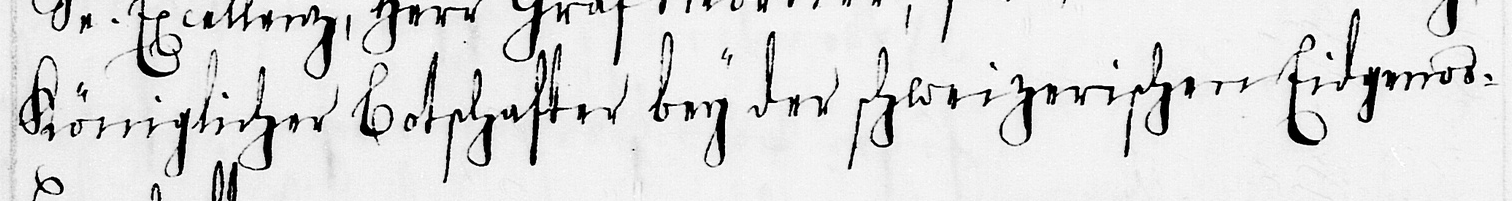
Königlicher Botschafter bey der schweizerischen Eidgenoß¬
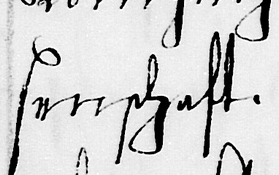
enschaft.
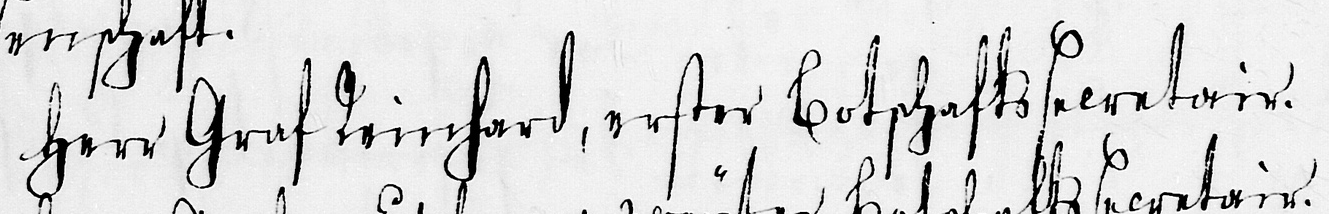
Herr Graf Reinhard, erster Botschaftssecretair.
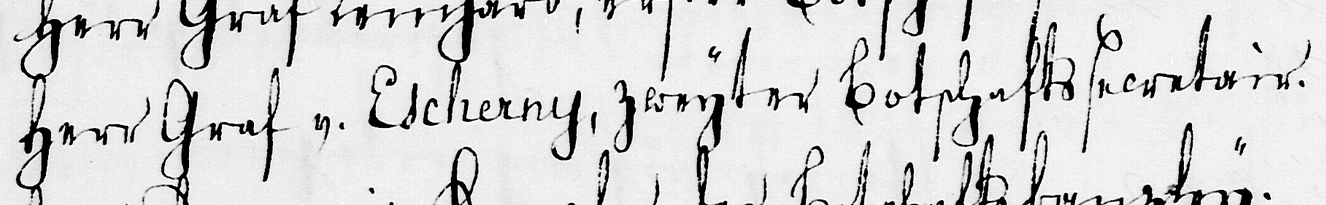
Herr Graf v. Escherny, zweyter Botschaftssecretair.
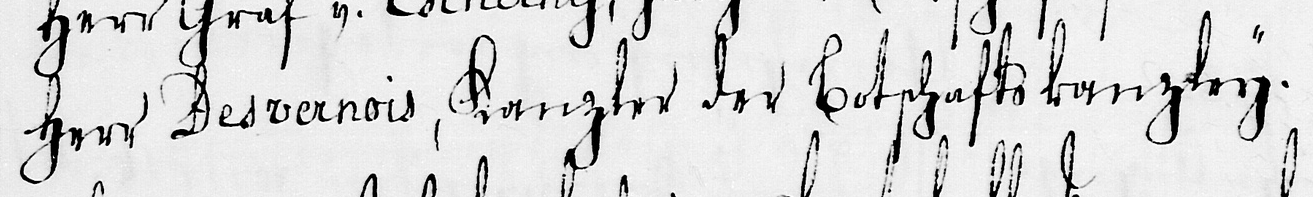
Herr Desvernois, Kanzler der Botschaftskanzley.
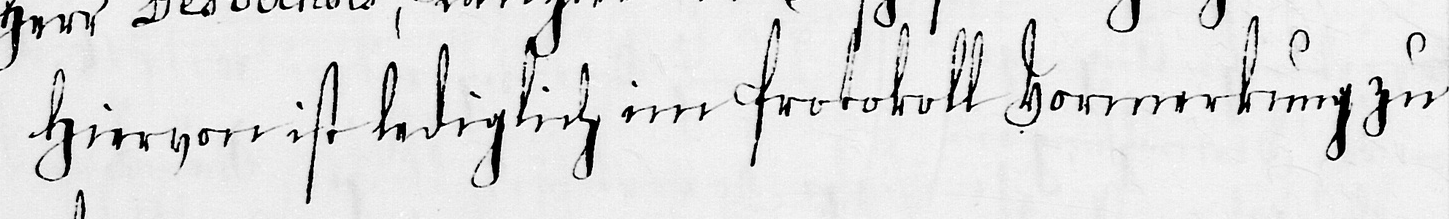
Hiervon ist lediglich im Protokoll Vormerkung zu
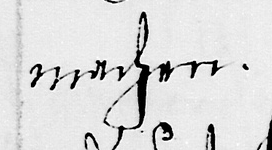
machen.
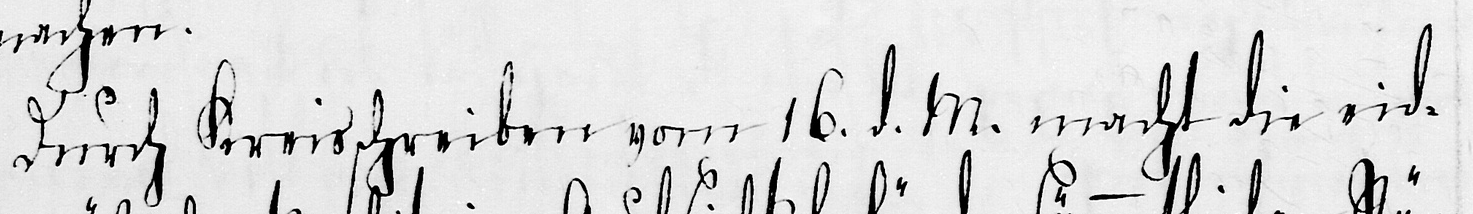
Durch Kreisschreiben vom 16. d. M. macht die eid¬
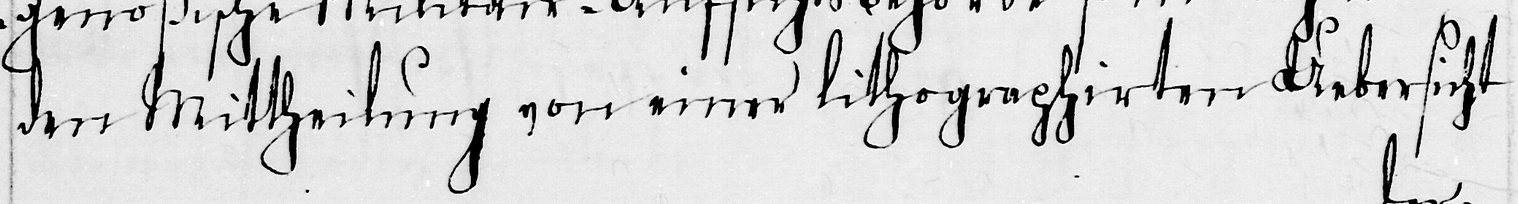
den Mittheilung von einer lithographirten Uebersicht
